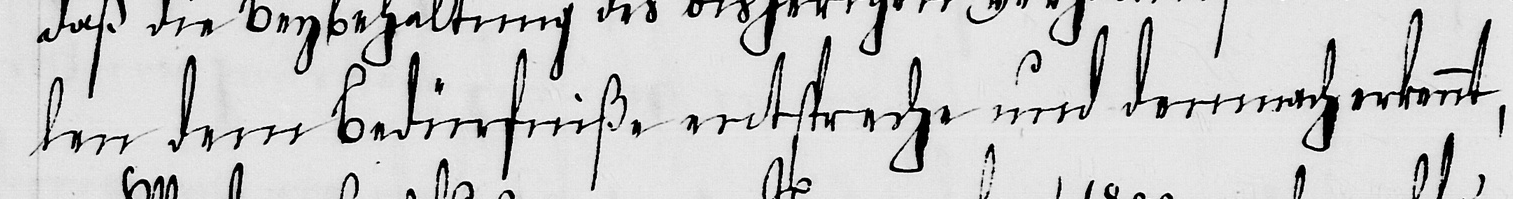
len dem Bedürfniße entspreche und demnach erken¬
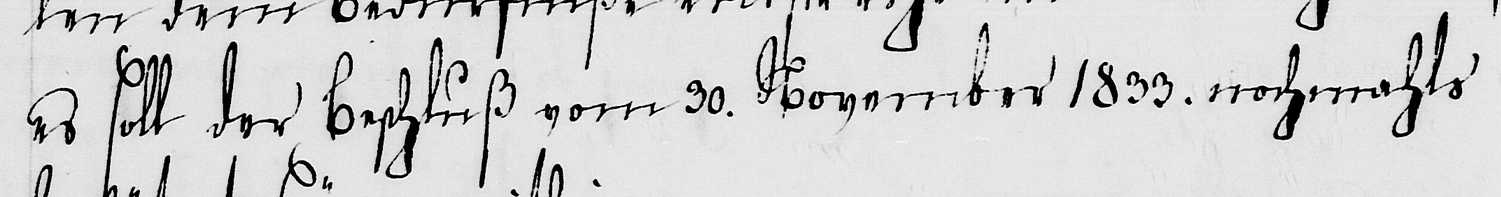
es soll der Beschluß vom 30. November 1833. nochmahls
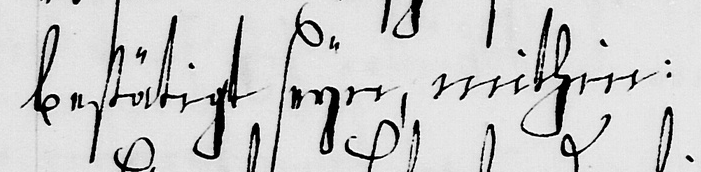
bestätigt seyn, mithin:
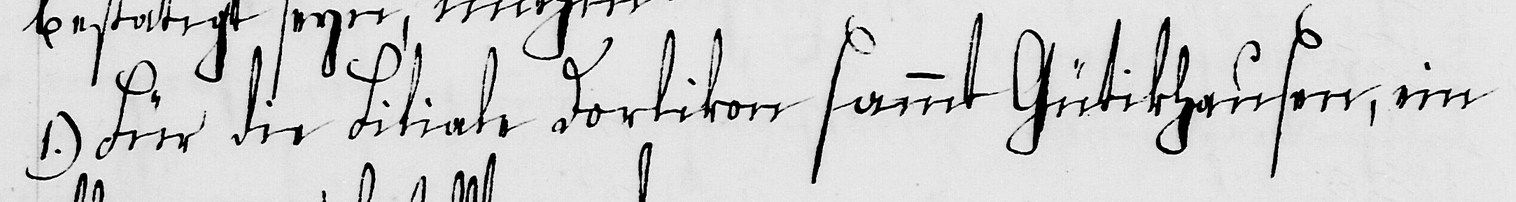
1.) Für die Filiale Dorlikon sammt Gütikhausen, ein
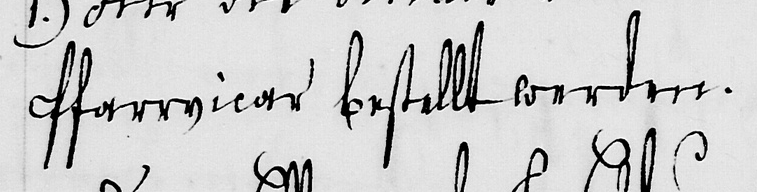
Pfarrvicar bestellt werden.
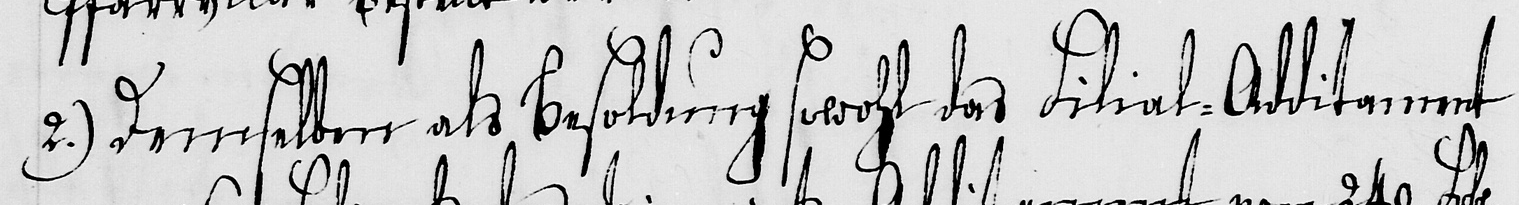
2.) Demselben als Besoldung sowohl das Filial-Additament
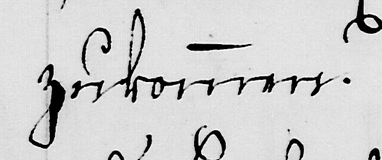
zukommen.
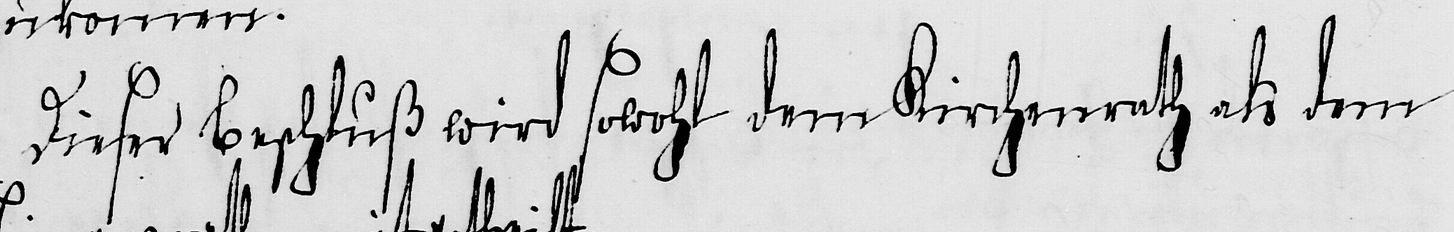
Dieser Beschluß wird sowohl dem Kirchenrath als dem
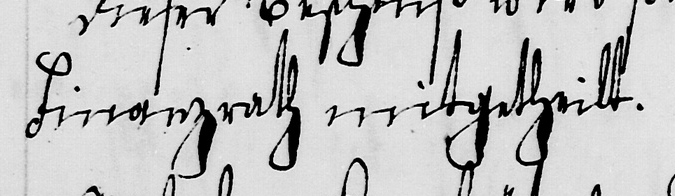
Finanzrath mitgetheilt.
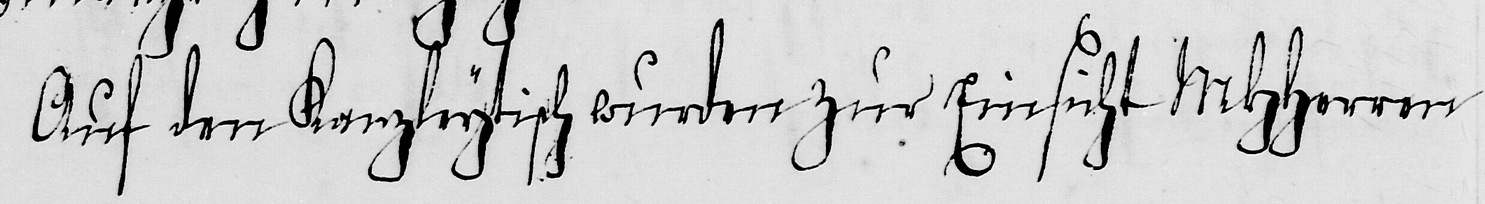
Auf den Kanzleytisch wurden zur Einsicht MHHerren
